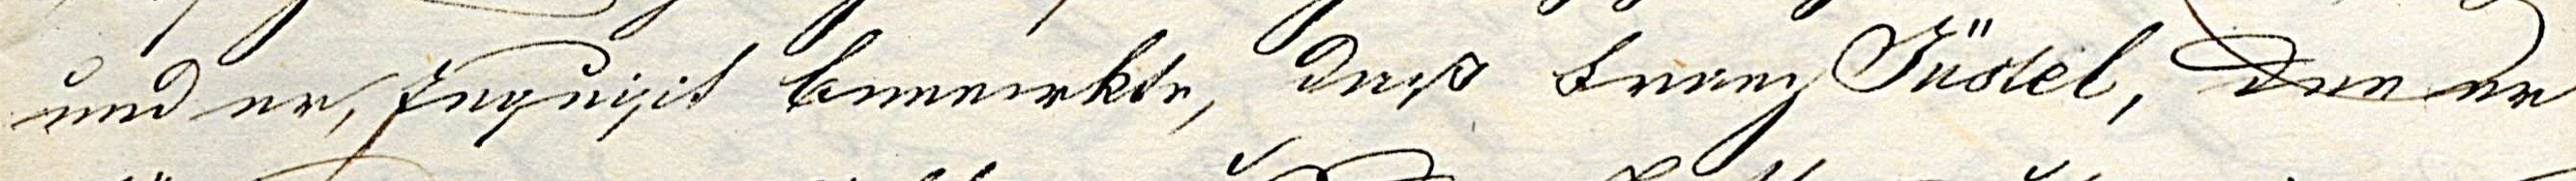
und er, Inquisit bemerkte, daß Franz Jüstel, dem er
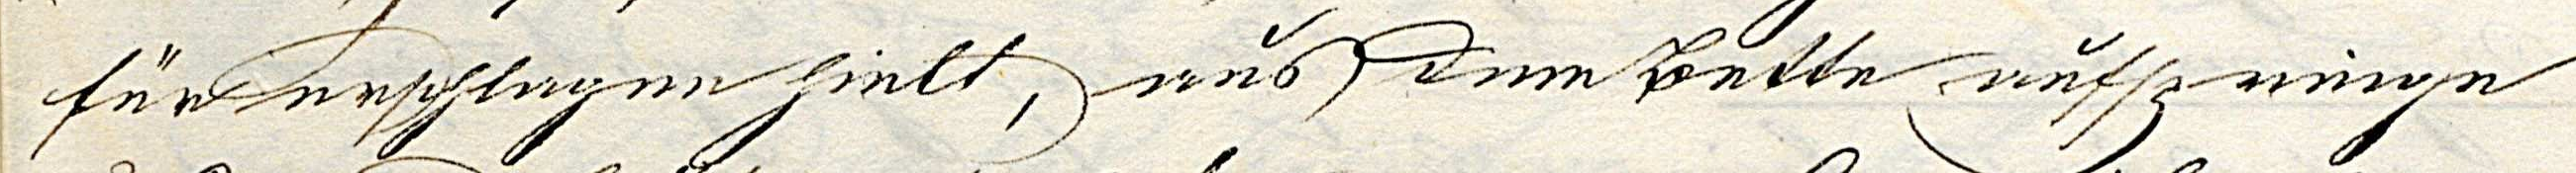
für erschlagen hielt, aus dem Bette aufspringe
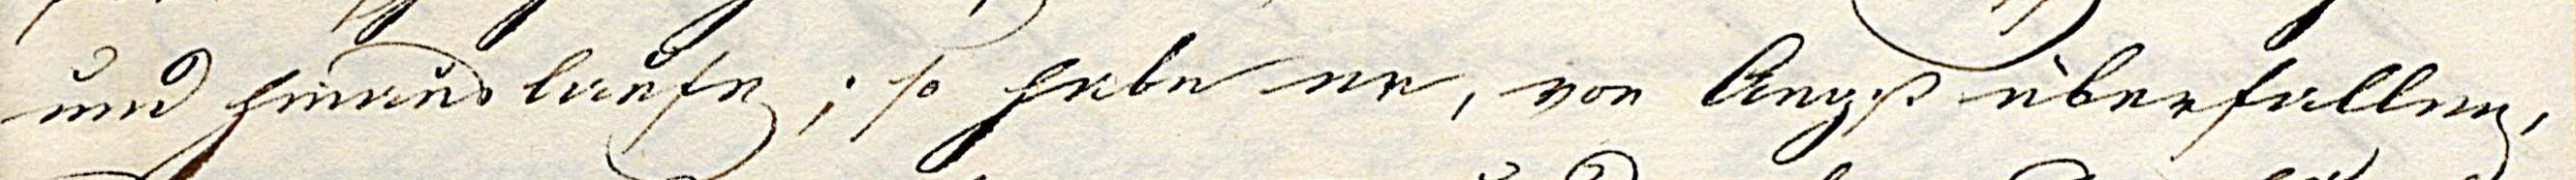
und hinauslaufe; so habe er, von Angst überfallen,
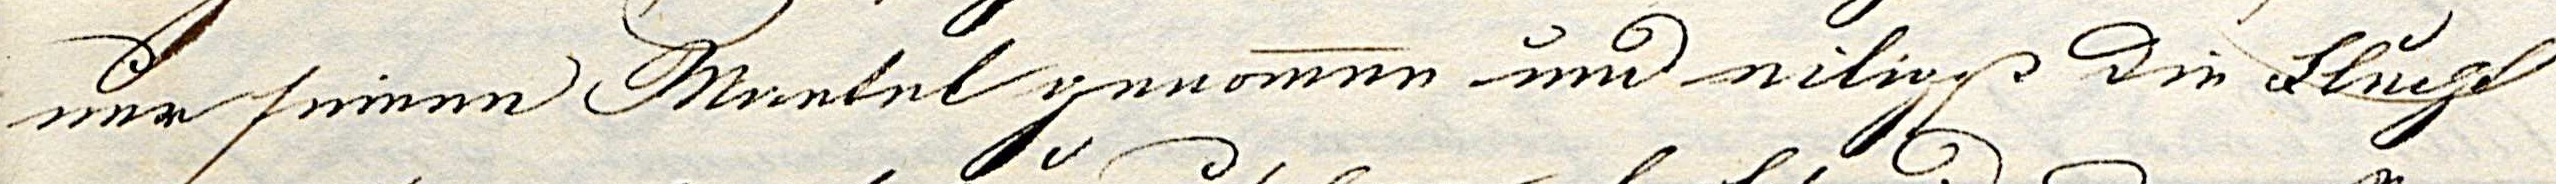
nur seinen Mantel genommen und eiligs die Flucht
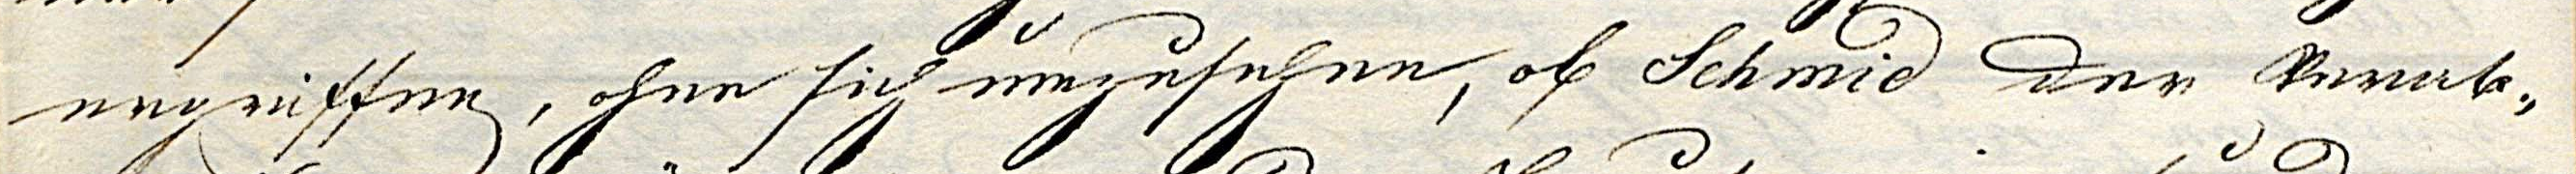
ergriffen, ohne sich umzusehen, ob Schmid der Verab¬
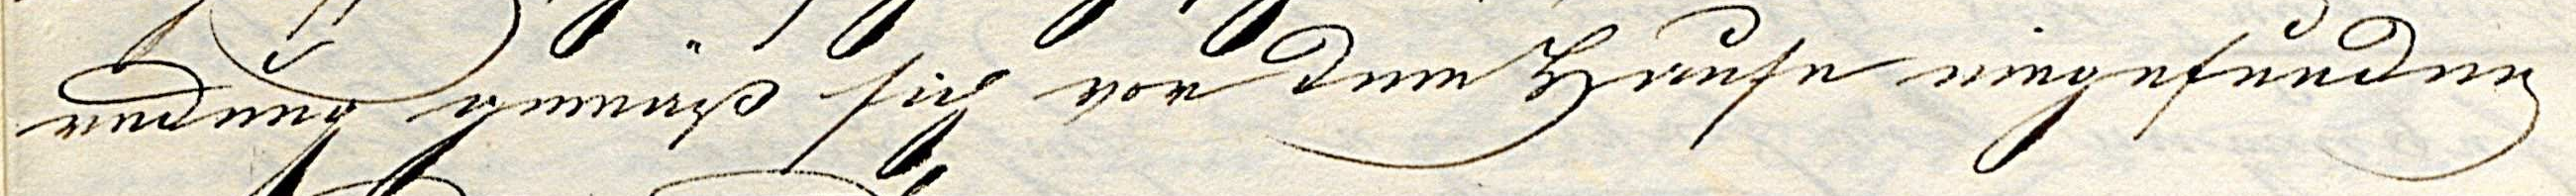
redung gemäß sich vor dem Hause eingefunden
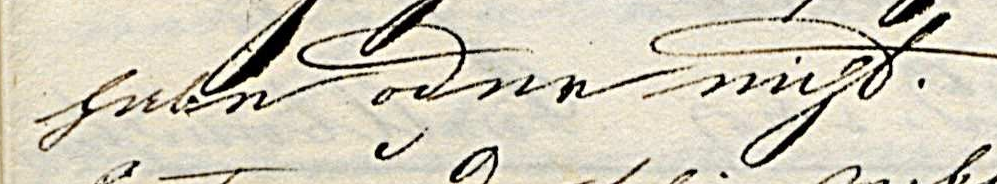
habe oder nicht.
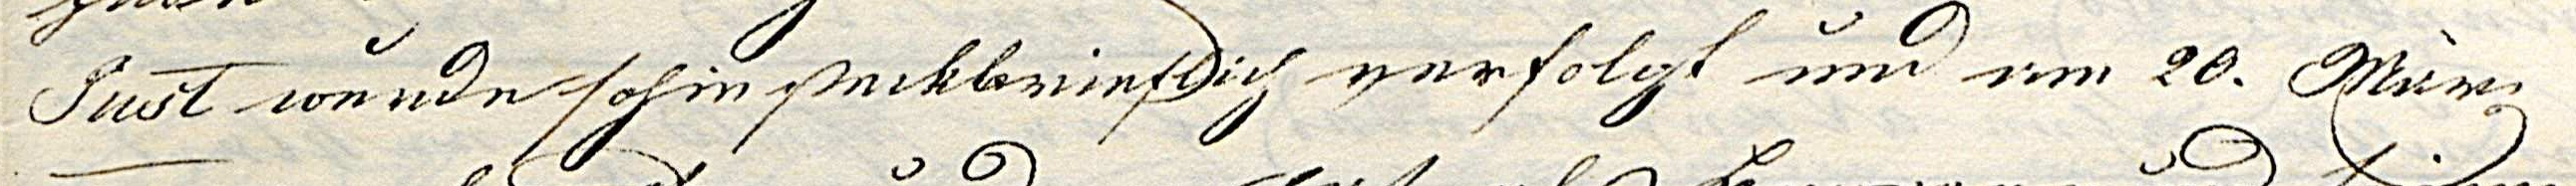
Just wurde sohin steckbrieflich verfolgt und am 20. März
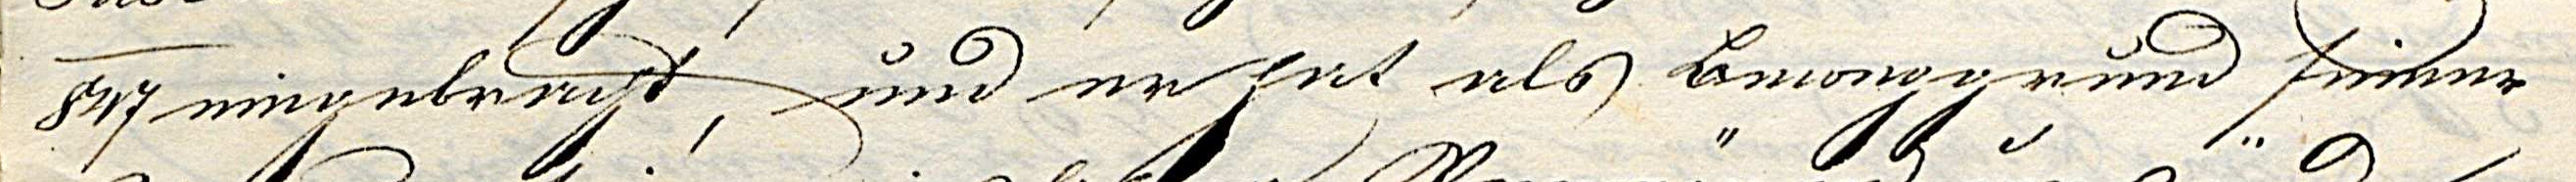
1847 eingebracht, und er hat als Beweggrund seiner
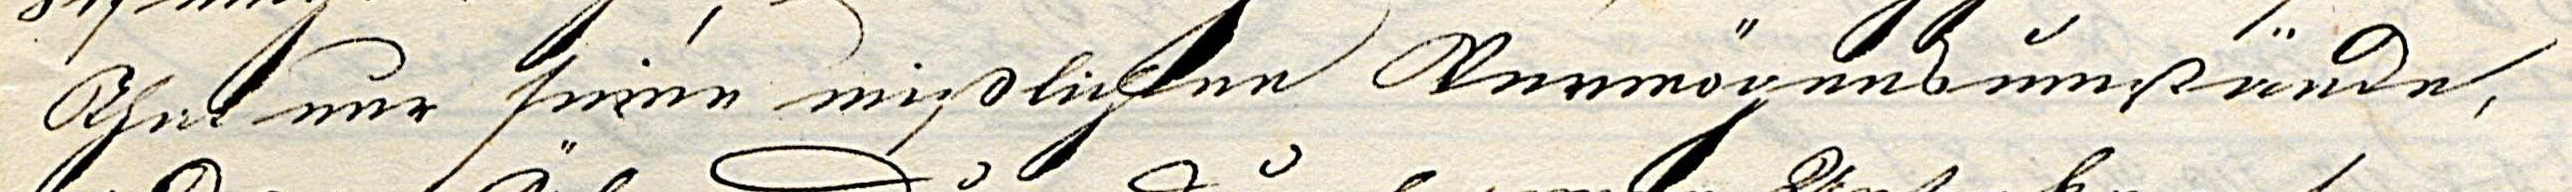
That nur seine mißlichen Vermögensumstände,
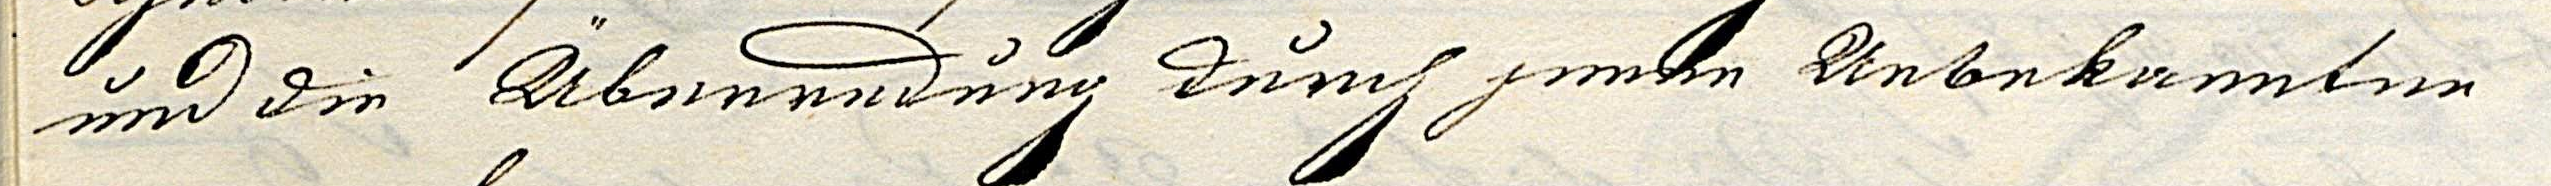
und die Überredung durch jenen Unbekannter
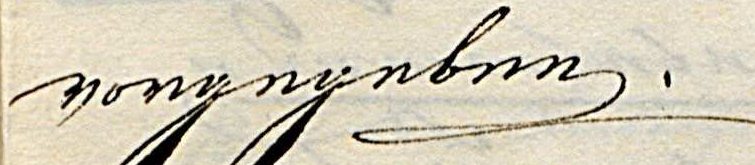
vorgegeben.
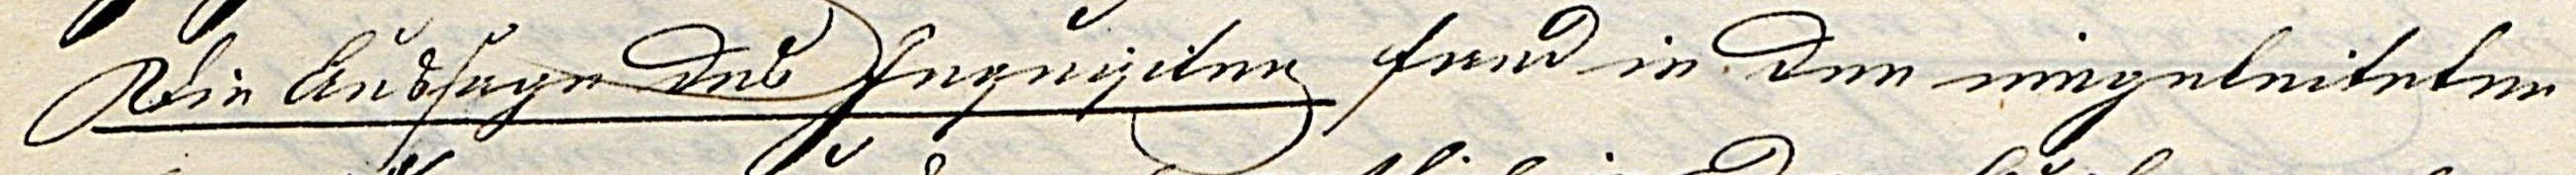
Die Aussage des Inquisiten fand in dem eingeleiteter
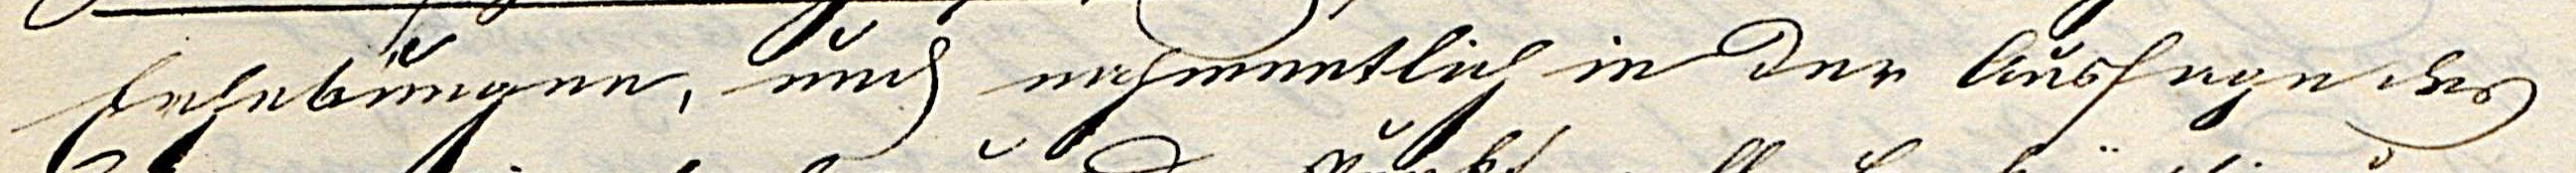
Erhebungen, auch nahmentlich in der Aussage des
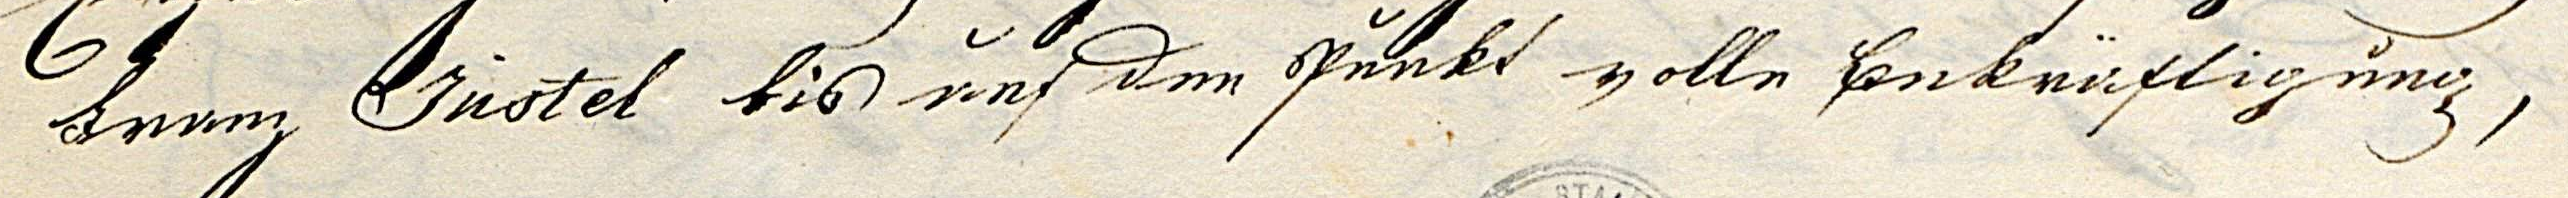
Franz Jüstel bis auf dem Punkt volle Bekräftigung,
